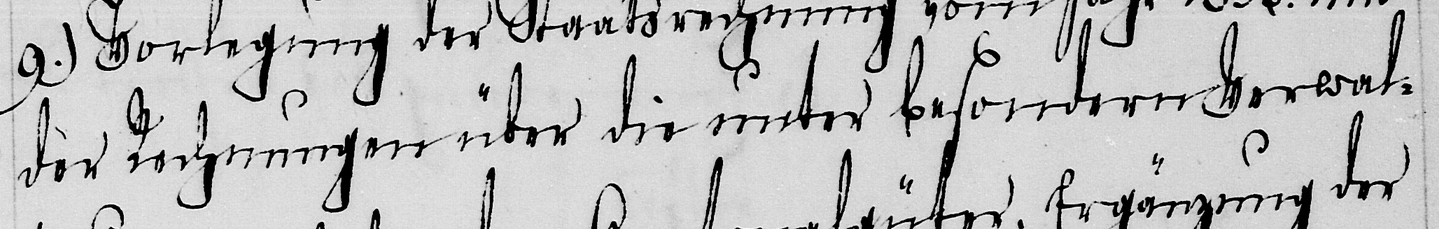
der Rechnungen über die unter besondern Verwal¬
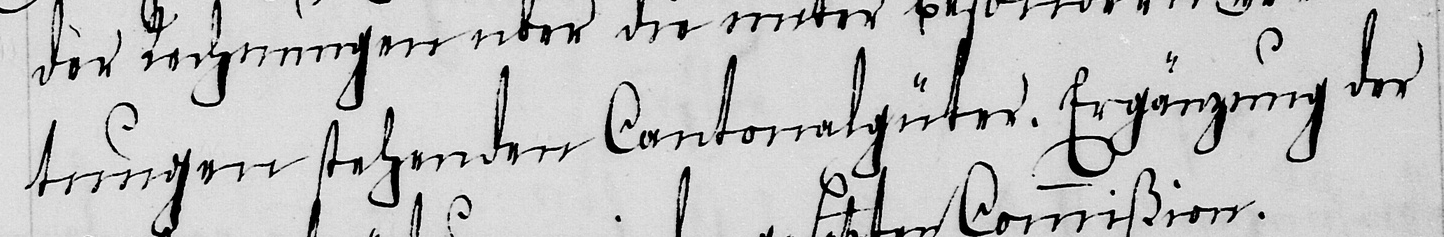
tungen stehenden Cantonalgüter. Ergänzung der
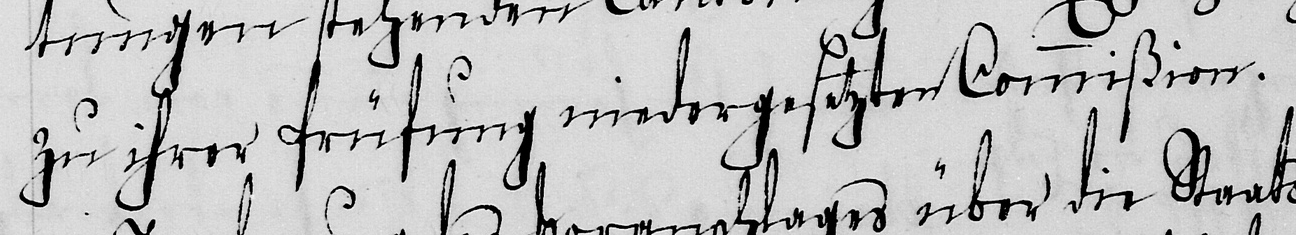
zu ihrer Prüfung niedergesetzten Commißion.
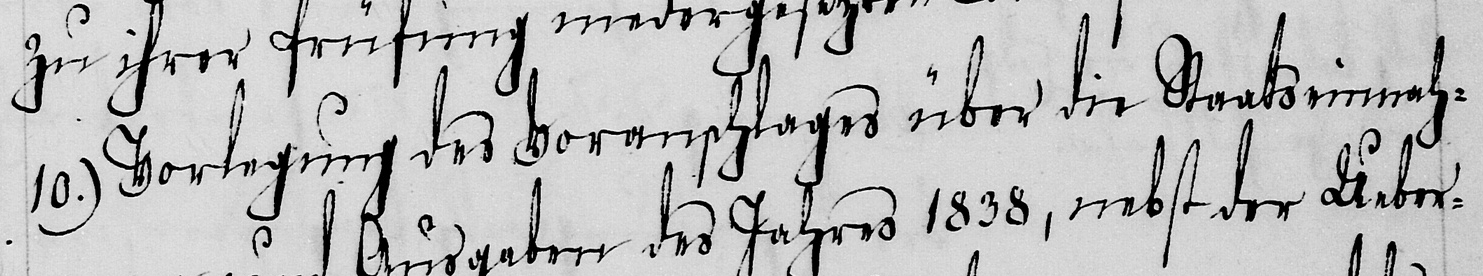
10.) Vorlegung des Voranschlages über die Staatseinnah¬
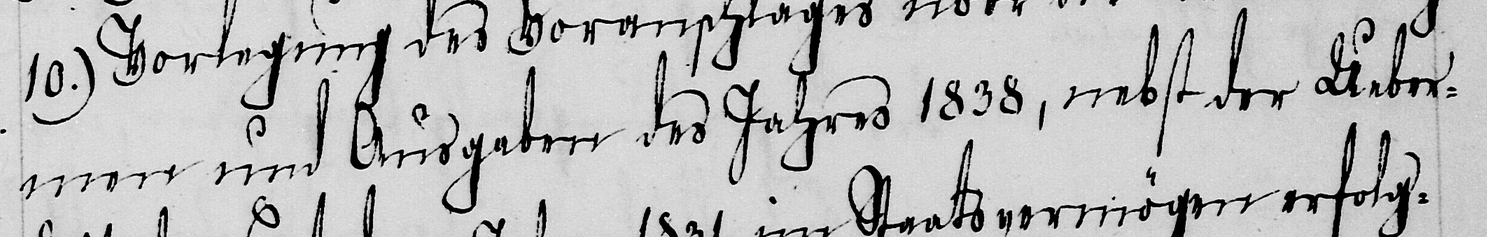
men und Ausgaben des Jahres 1838, nebst der Ueber¬
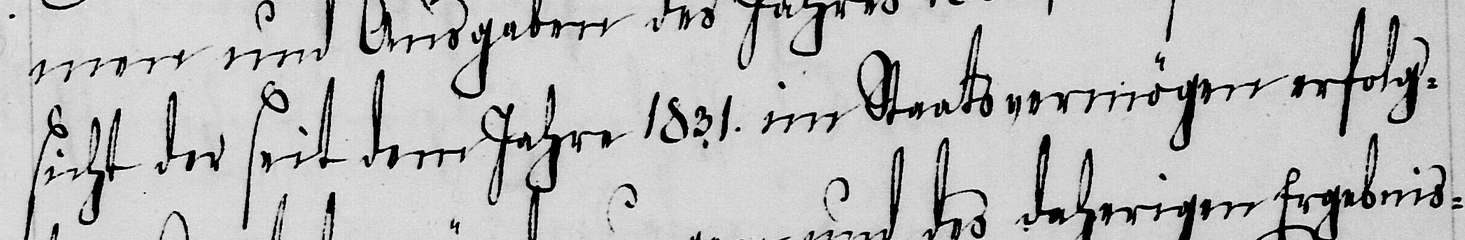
sicht der seit dem Jahre 1831. im Staatsvermögen erfolg¬
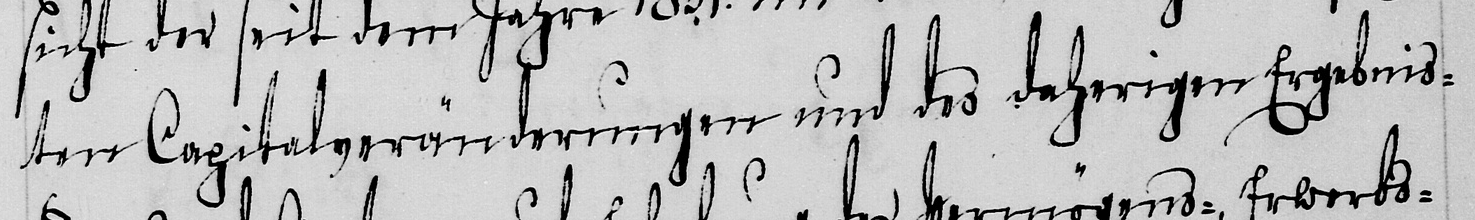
ten Capitalveränderungen und des daherigen Ergebniß¬
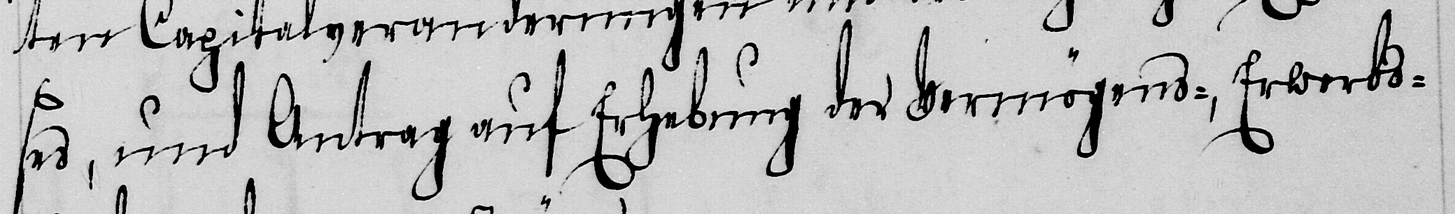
es, und Antrag auf Erhebung der Vermögens-, Erwerbs-
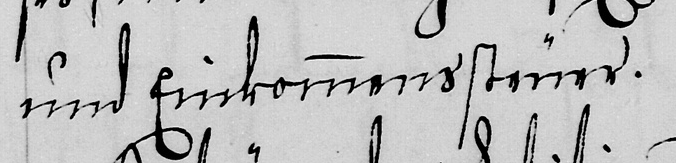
und Einkommenssteuer.
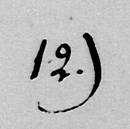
11.)
